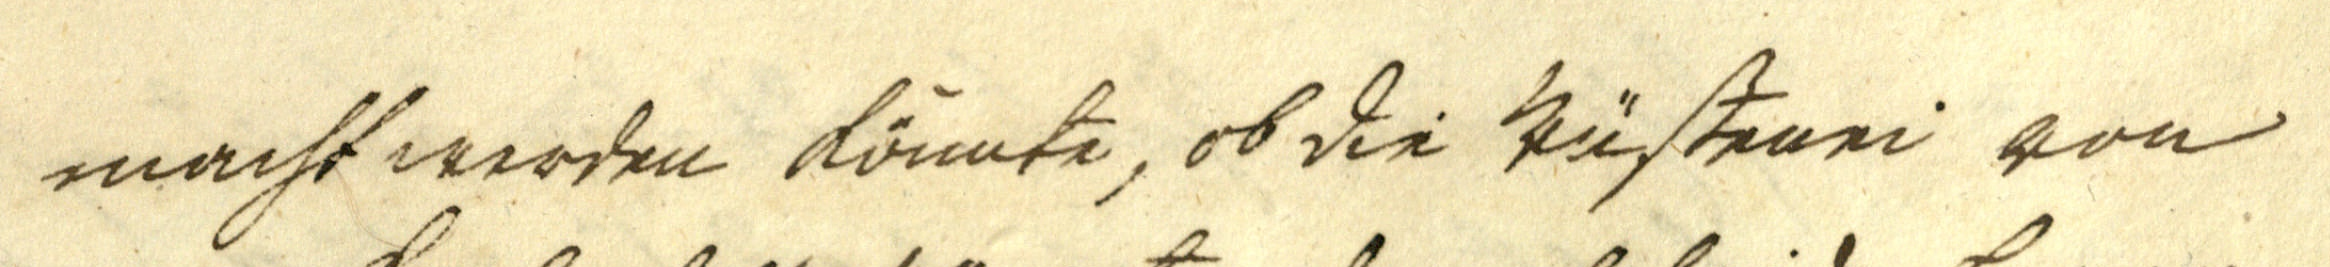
macht werden könnte, ob die Wüstenei von
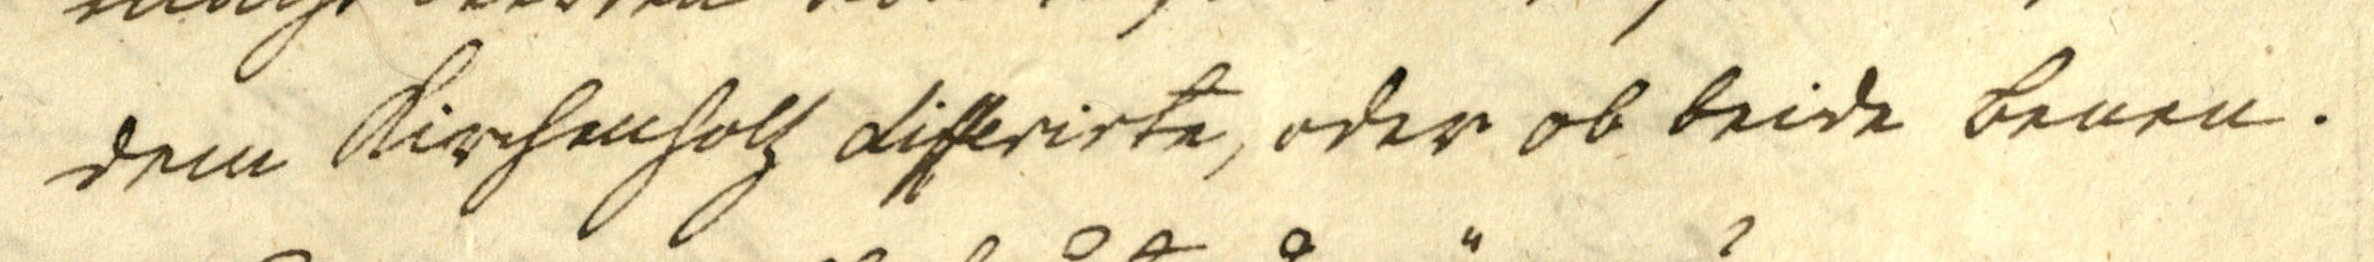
dem Kirchenholz differirte, der ob beide Benen¬
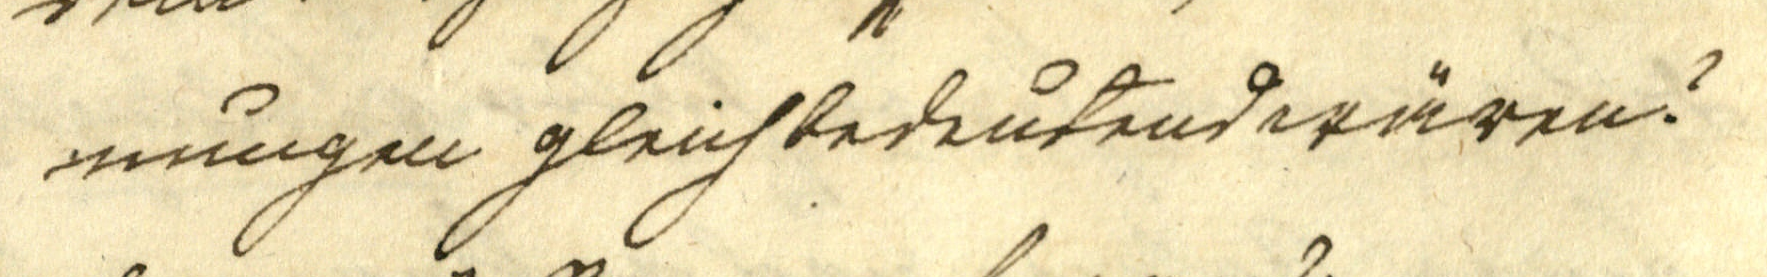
nungen gleichbedeutend wären?
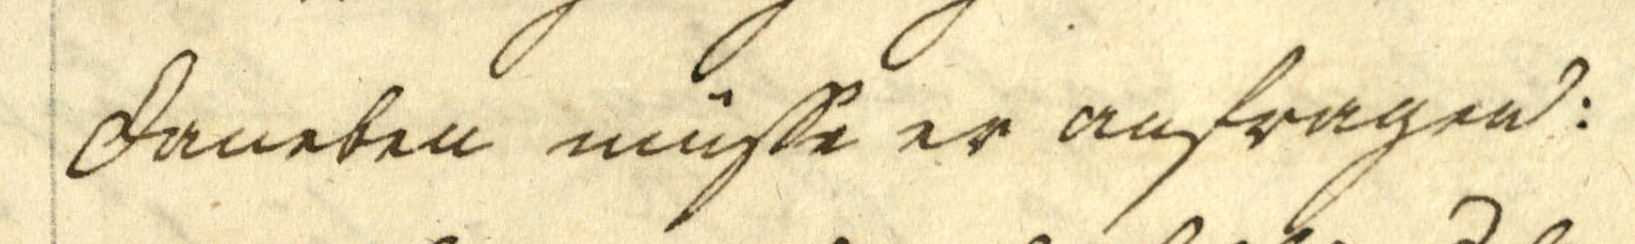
Daneben müsse er anfragen:
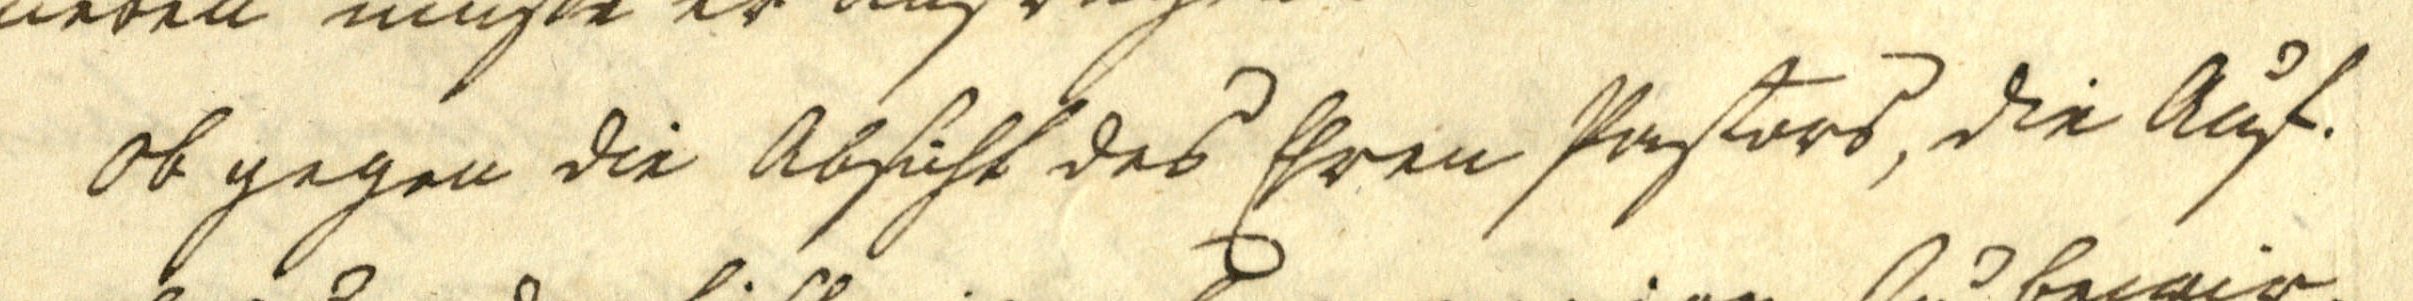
ob gegen die Absicht des Ehren Pastors, die Auf¬
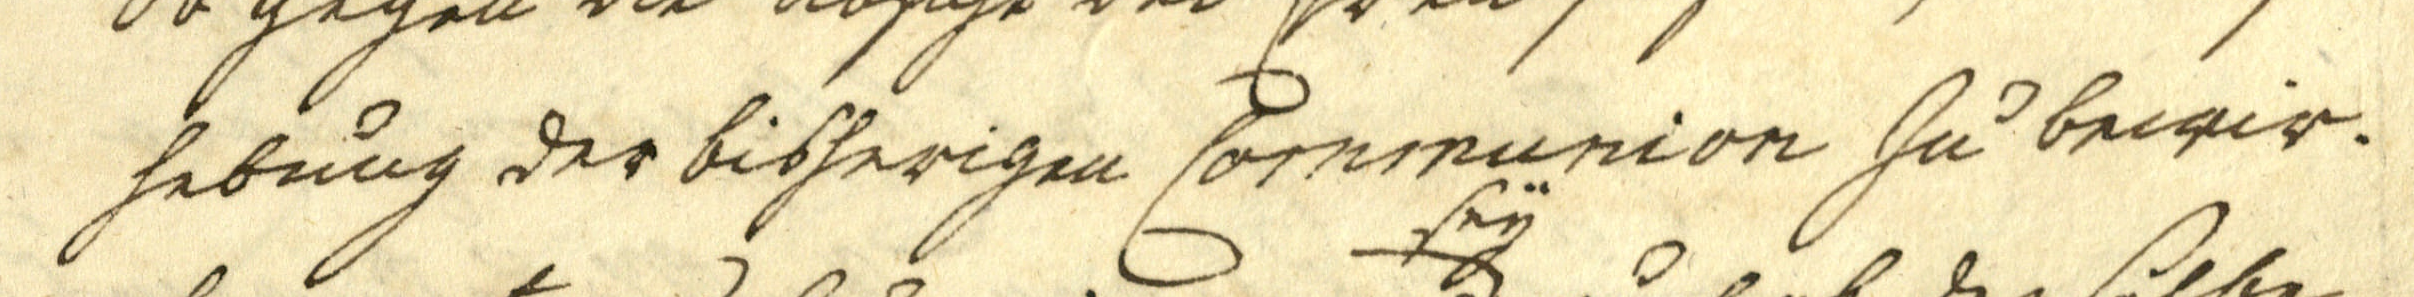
hebung der bisherigen Communion zu bewir¬
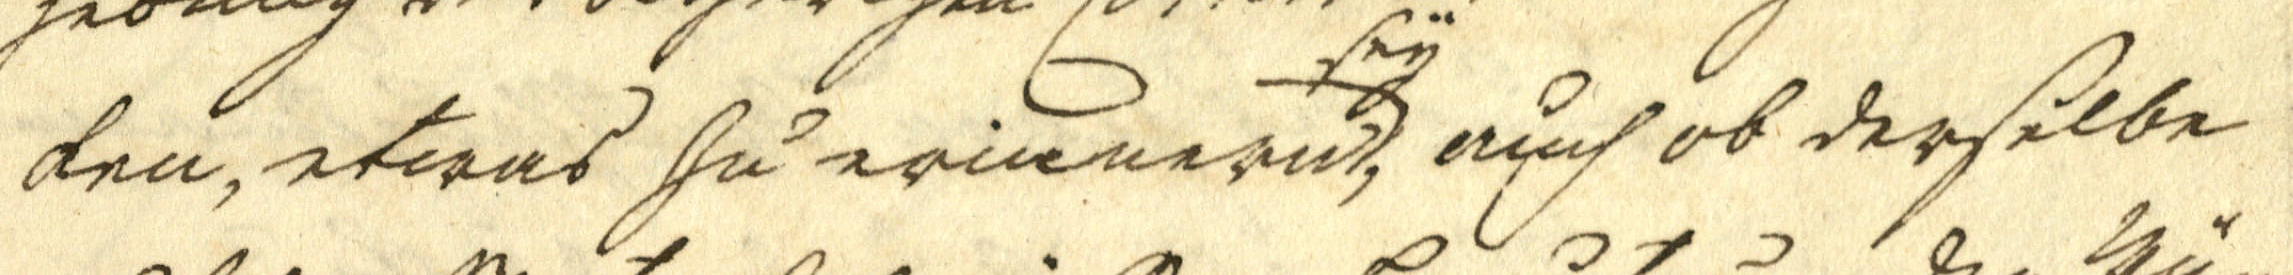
ken, etwas zu erinnern seÿ, auch ob derselbe
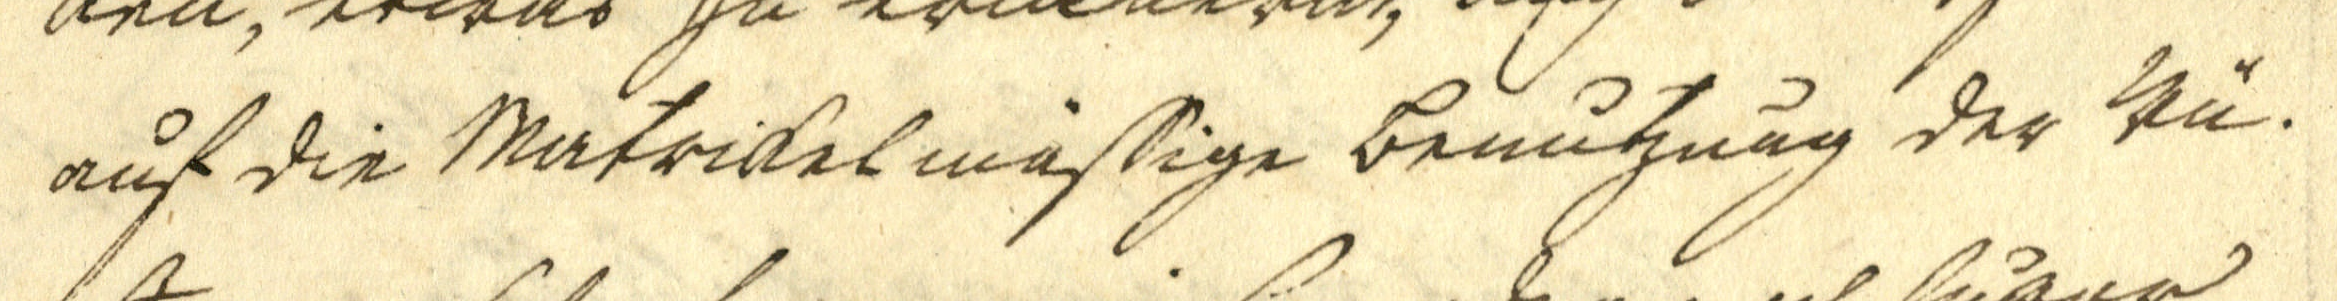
auf die Matrikel mässige Benutzung der Wü¬
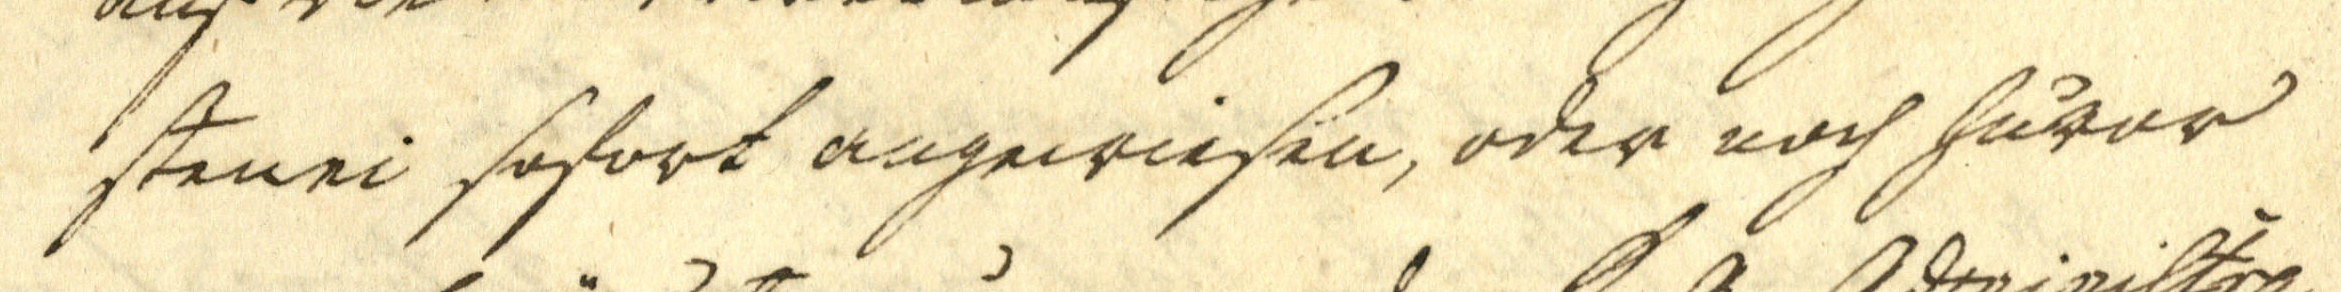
stenei sofort angewiesen, oder noch zuvor
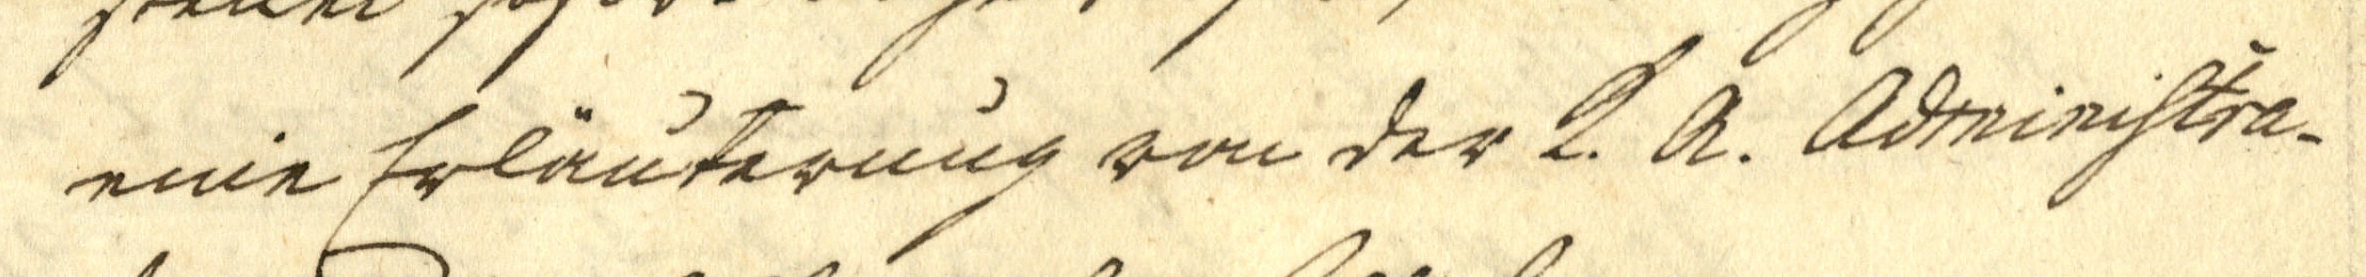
eine Erläuterung von der K. A. Administra¬
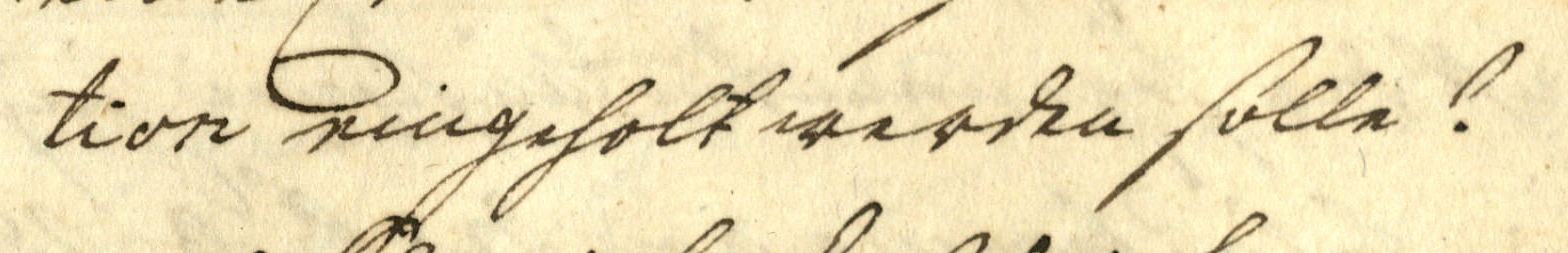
tion eingeholt werden solle?
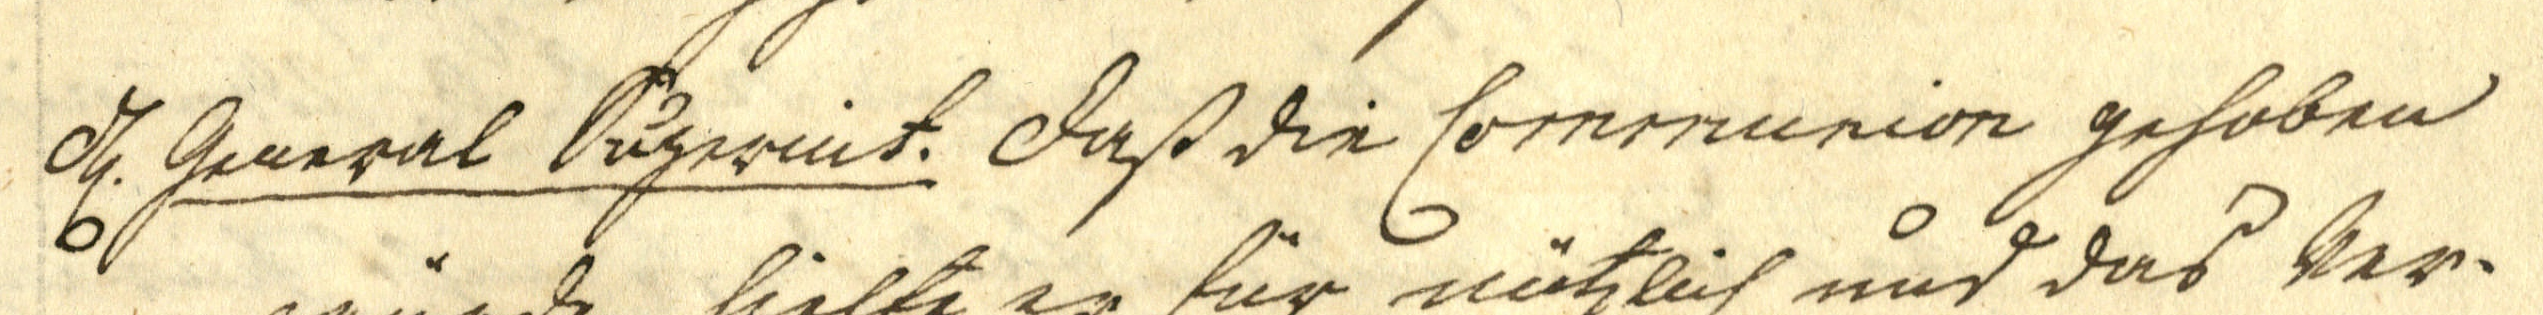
dh. General Superint. Daß die Communion gehoben
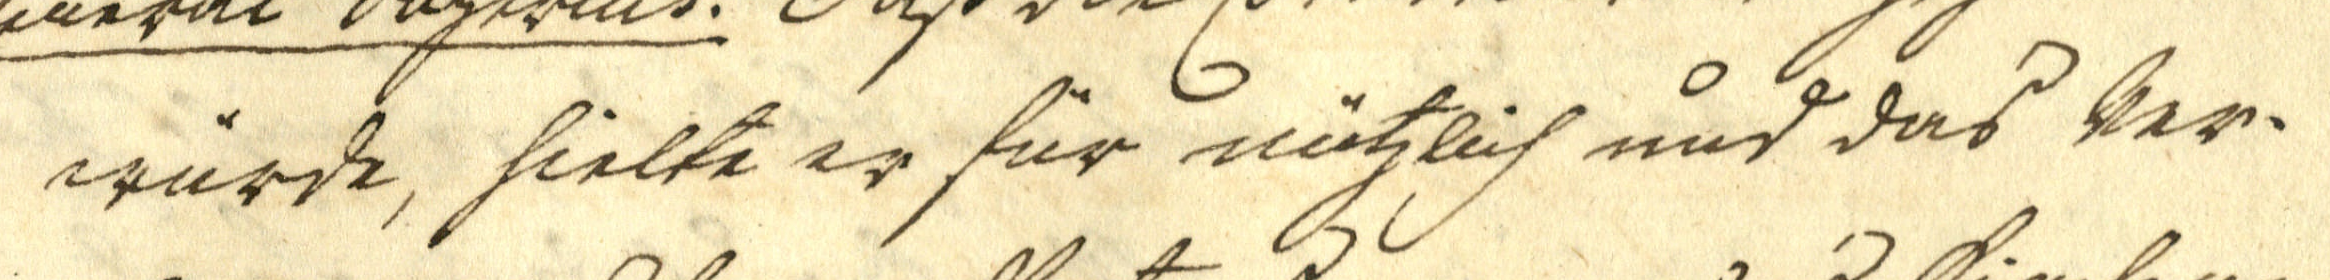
würde, hielte er für nützlich und das Ver¬
